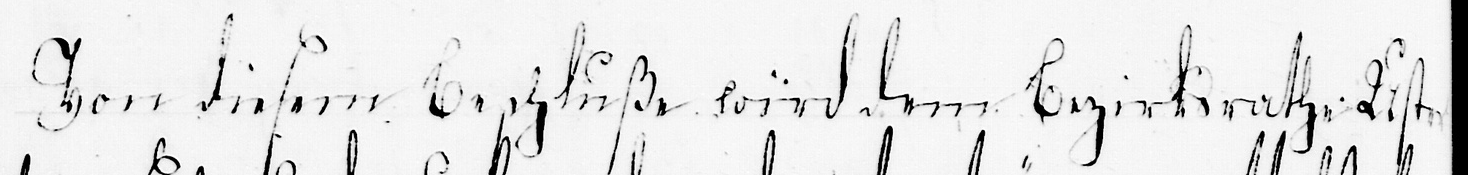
Von diesem Beschluße wird dem Bezirksrathe Uster
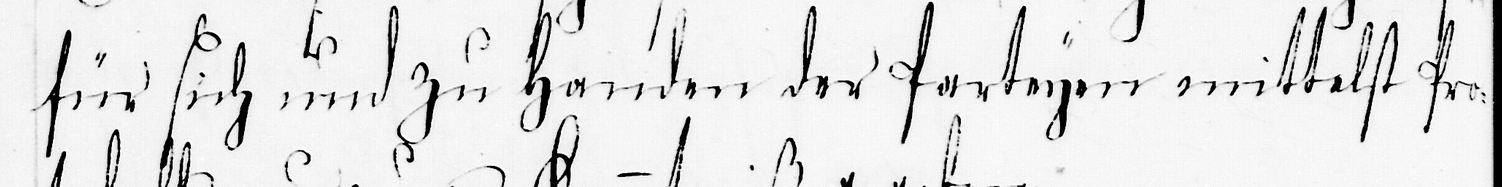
für sich und zu Handen der Parteyen mittelst Pr¬
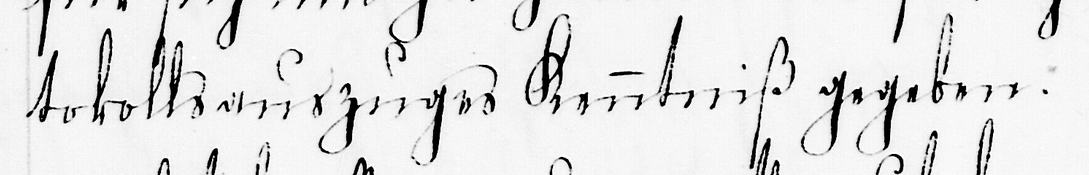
otokollsauszuges Kenntniß gegeben.
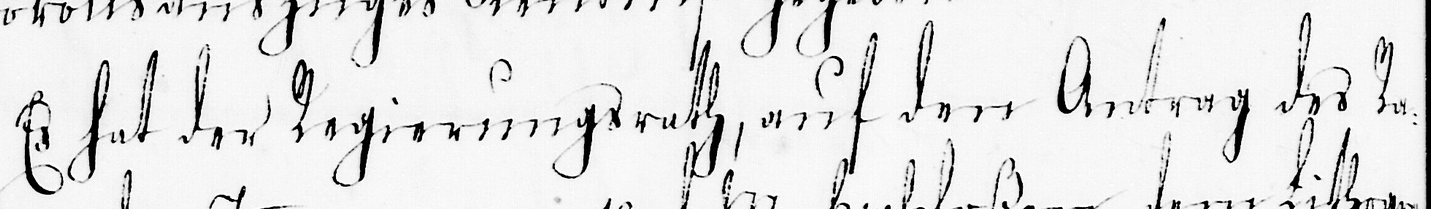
s hat der Regierungsrath, auf den Antrag des R¬
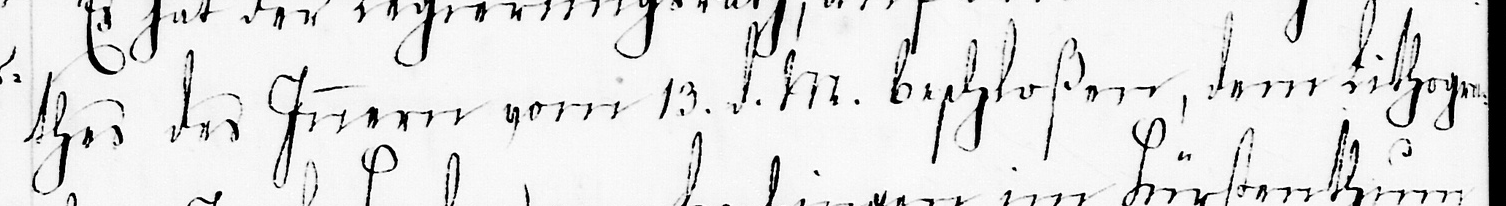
athes des Innern vom 13. d. M. beschloßen, dem Lithogra¬
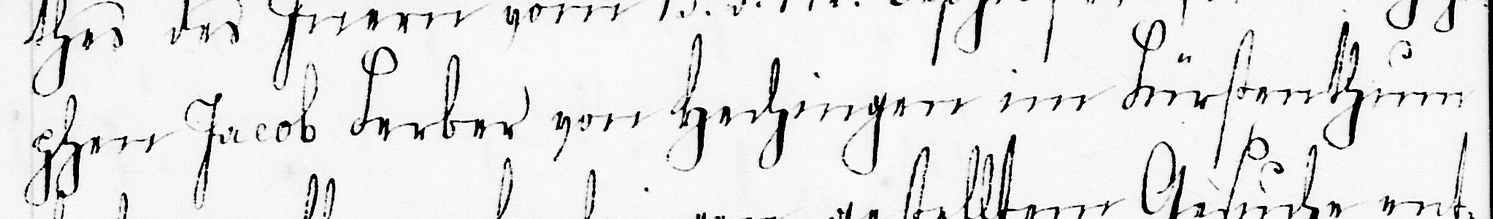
phen Jacob Ferber von Hechingen im Fürstenthum
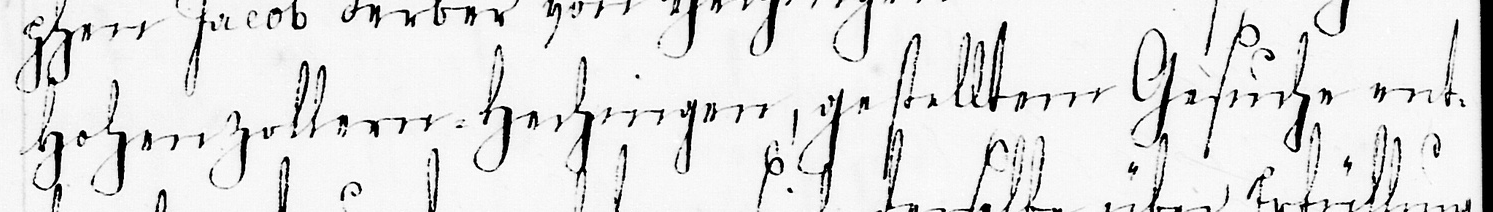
Hohenzollern-Hechingen, gestelltem Gesuche en¬
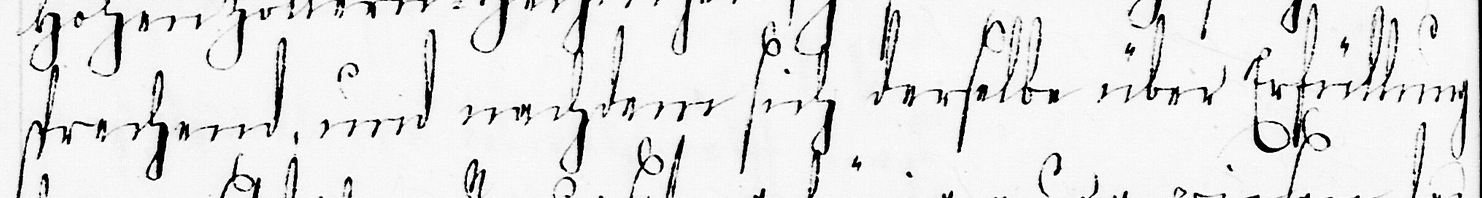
sprechend, und nachdem sich derselbe über Erfüllung
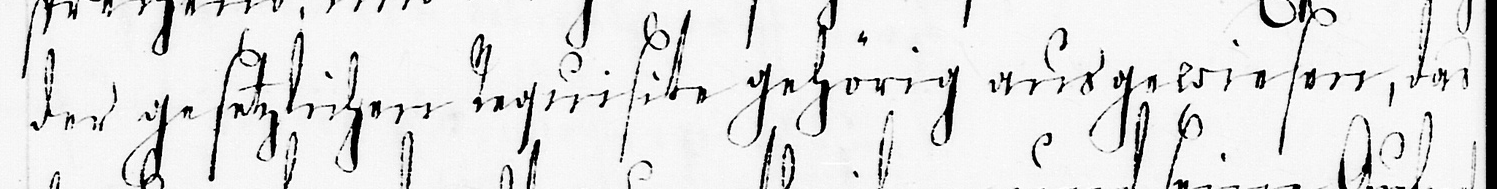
der gesetzlichen Requisite gehörig ausgewiesen, das
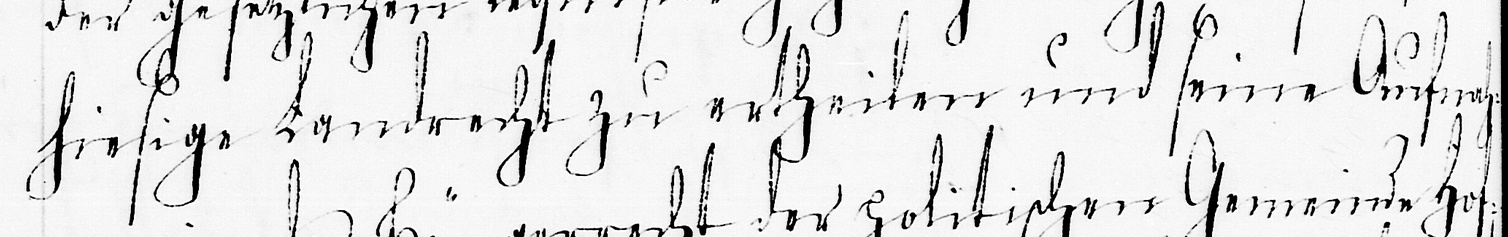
hiesige Landrecht zu ertheilen und seine Aufna¬
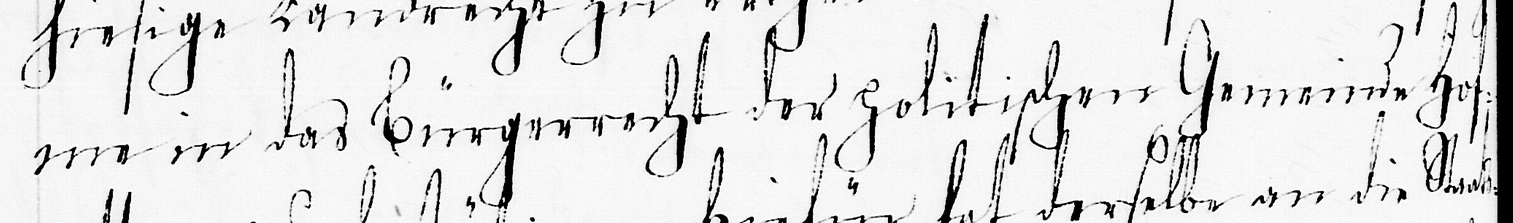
hme in das Bürgerrecht der politischen Gemeinde Hof¬
